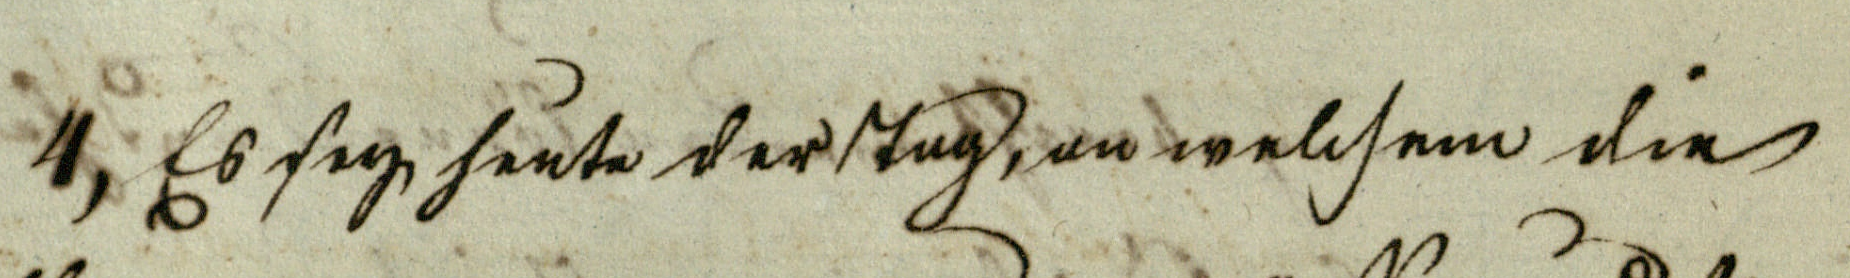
4, Es sey heute der Tag, an welchem die
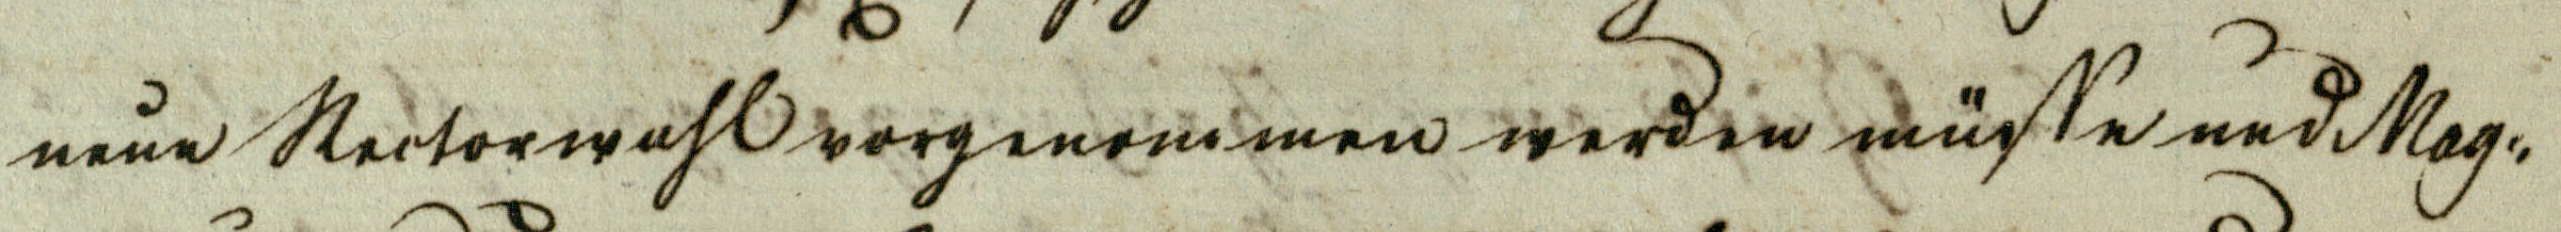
neue Rectorwahl vorgenommen werden müsse und Mag¬
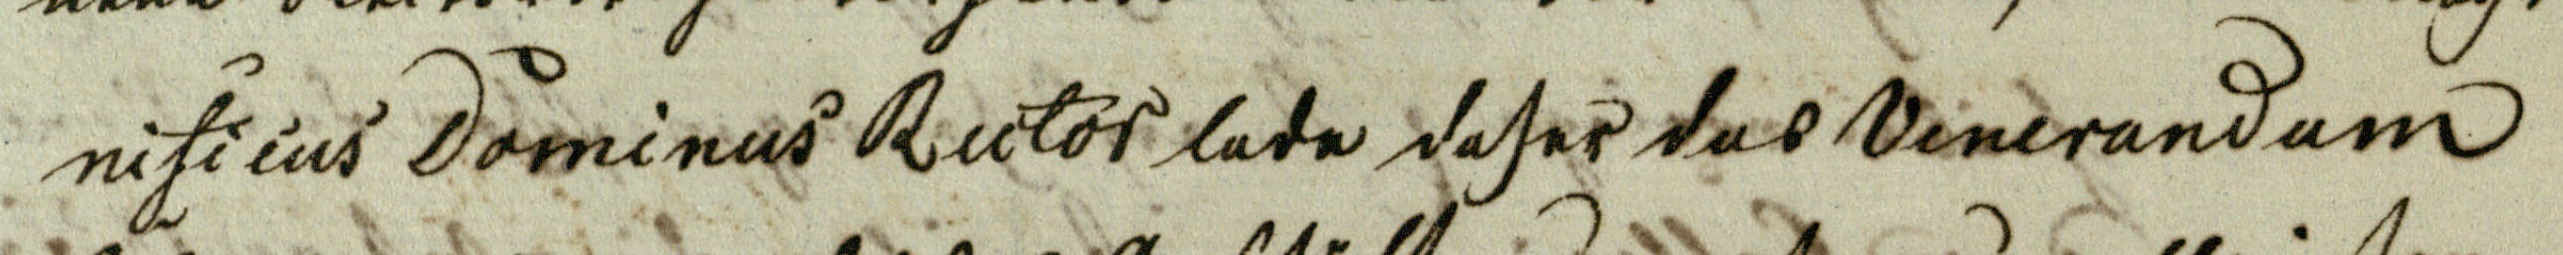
nificus Dominus Rector lade daher das Venerandum
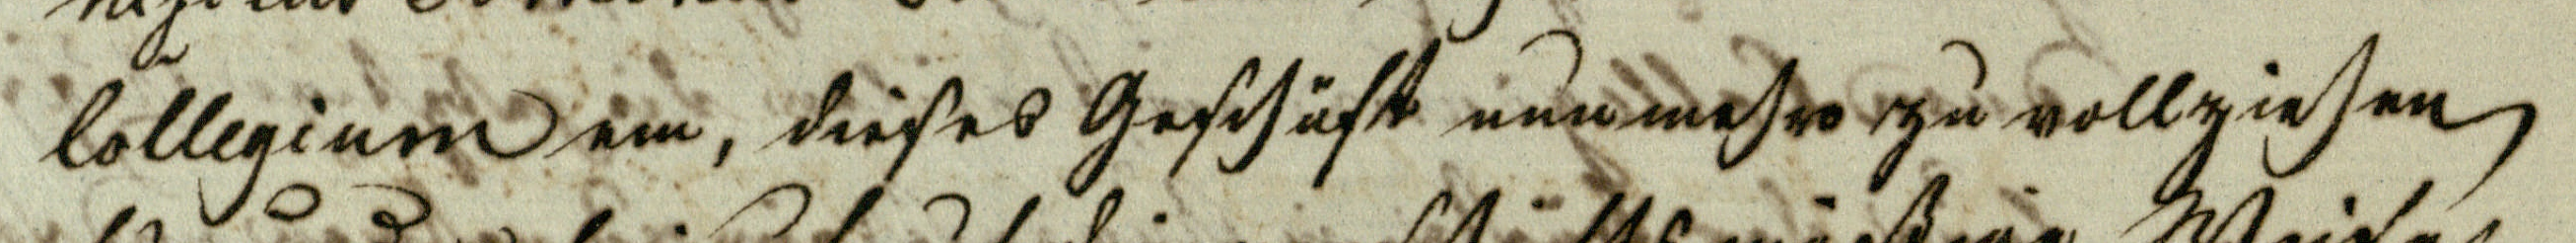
Collegium ein, dieses Geschäft nunmehro zu vollziehen.
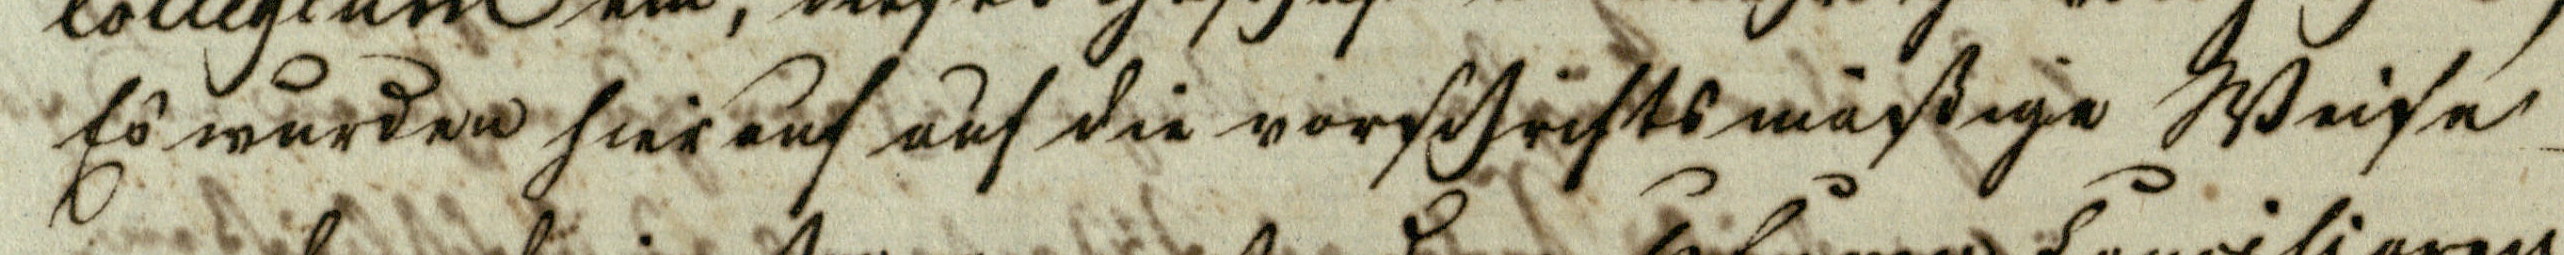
Es wurden hierauf auf die vorschriftsmäßige Weise
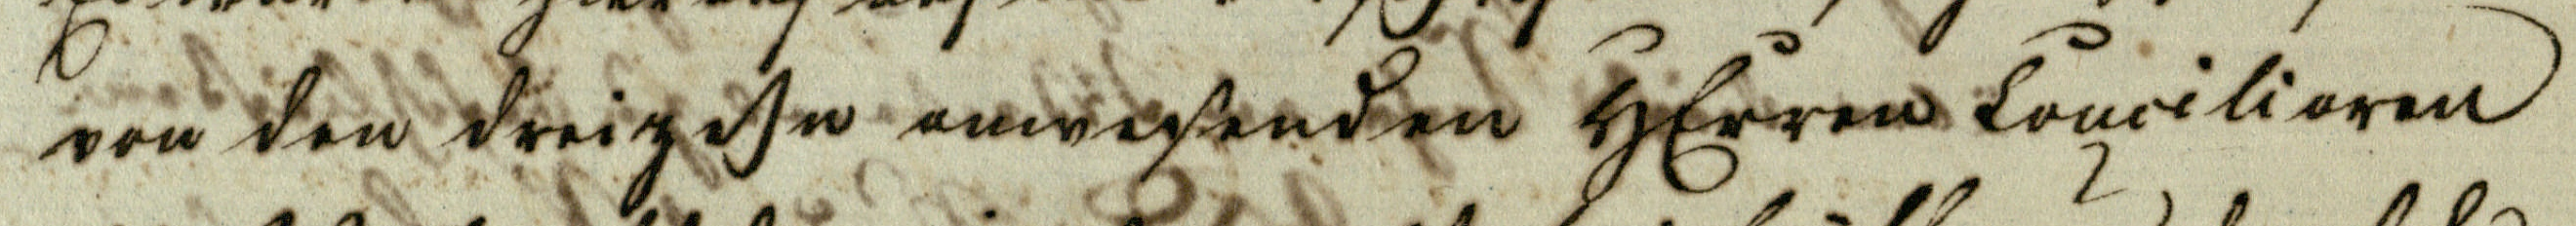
von den dreizehn anwesenden Herren Conciliaren
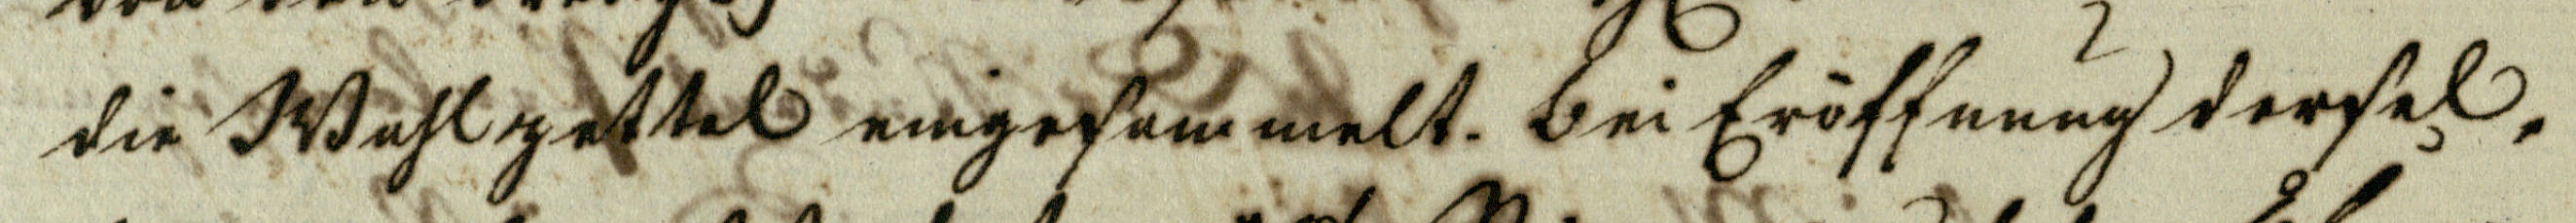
die Wahlzettel eingesammelt. Bei Eröffnung dersel¬
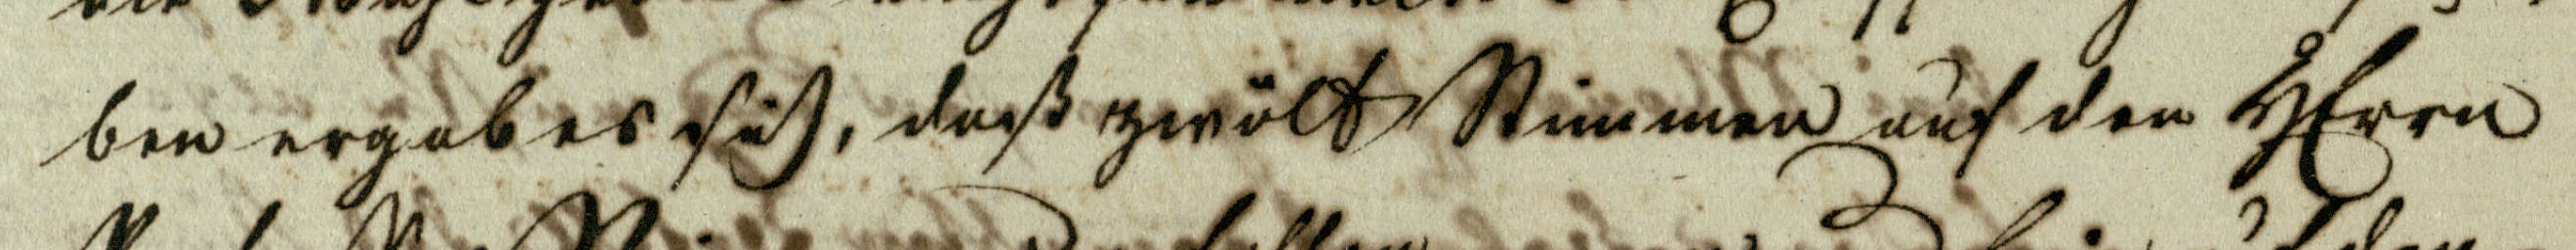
ben ergäbe sich, daß zwölf Stimmen auf den Herrn
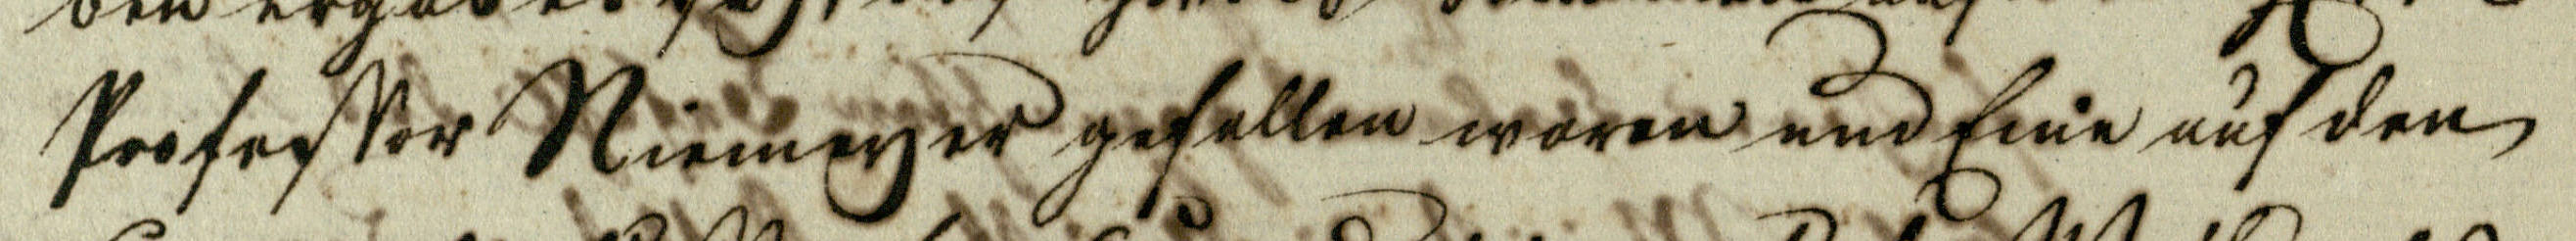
Professor Niemeyer gefallen waren und eine auf den
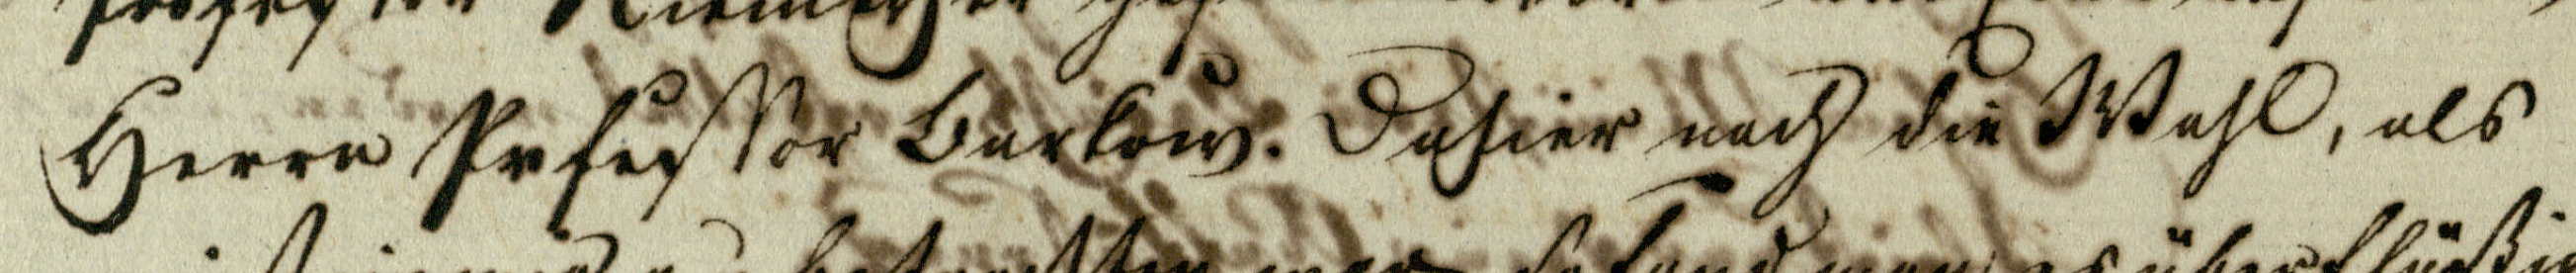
Herrn Professor Barkow. Dahier nach die Wahl, als
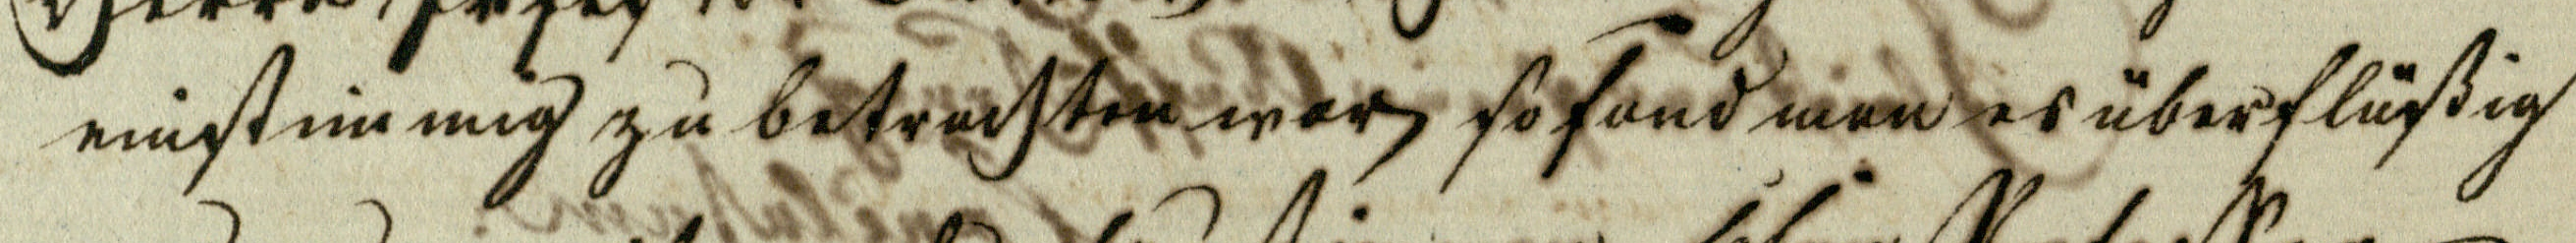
einstimmig zu betrachten war, so fand man es überflüßig
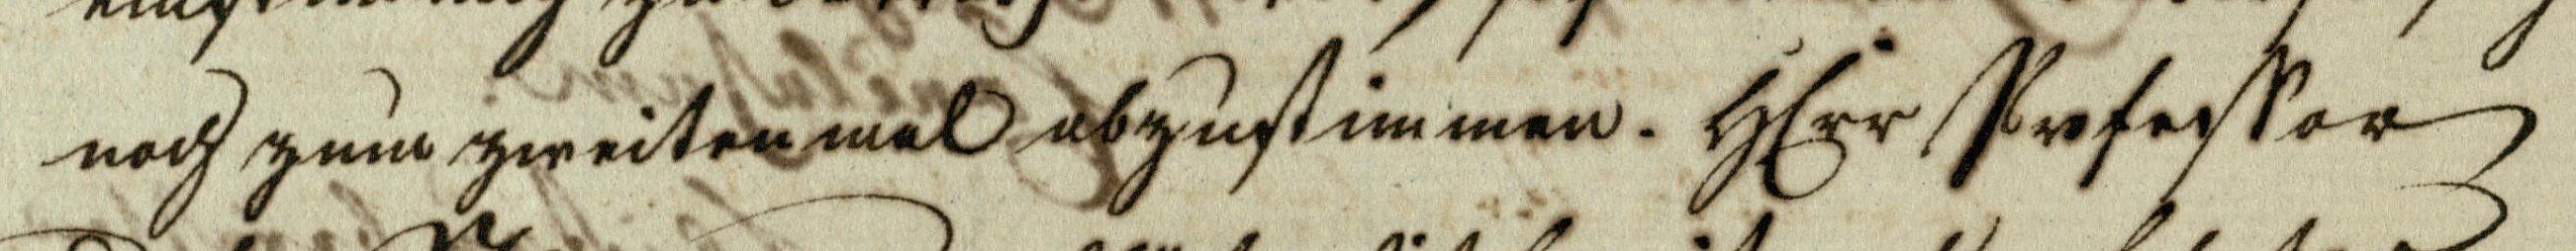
noch zum zweitenmal abzustimmen. Herr Professor
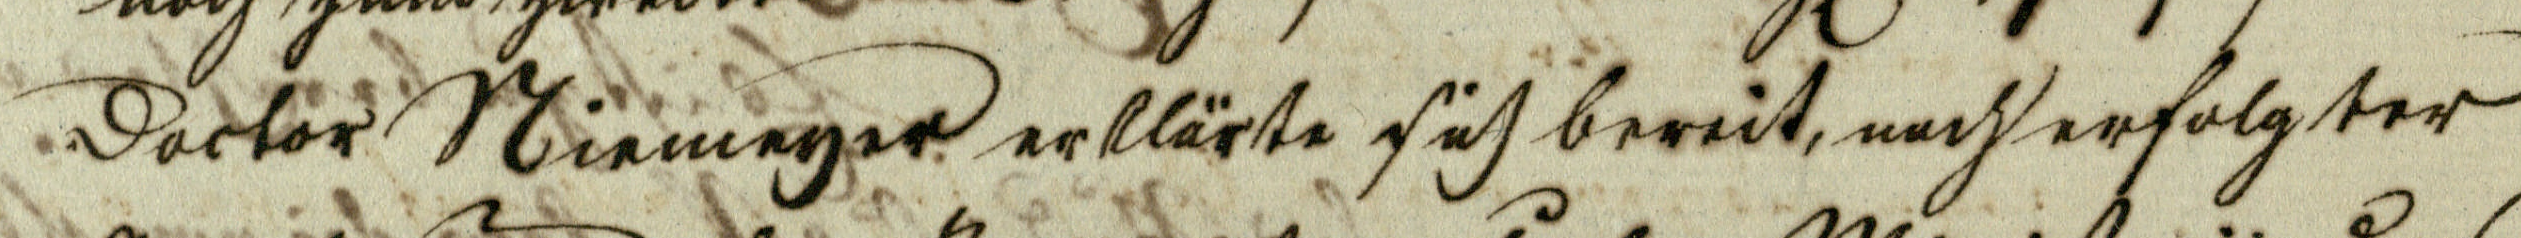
Doctor Niemeyer erklärte sich bereit, nach erfolgter
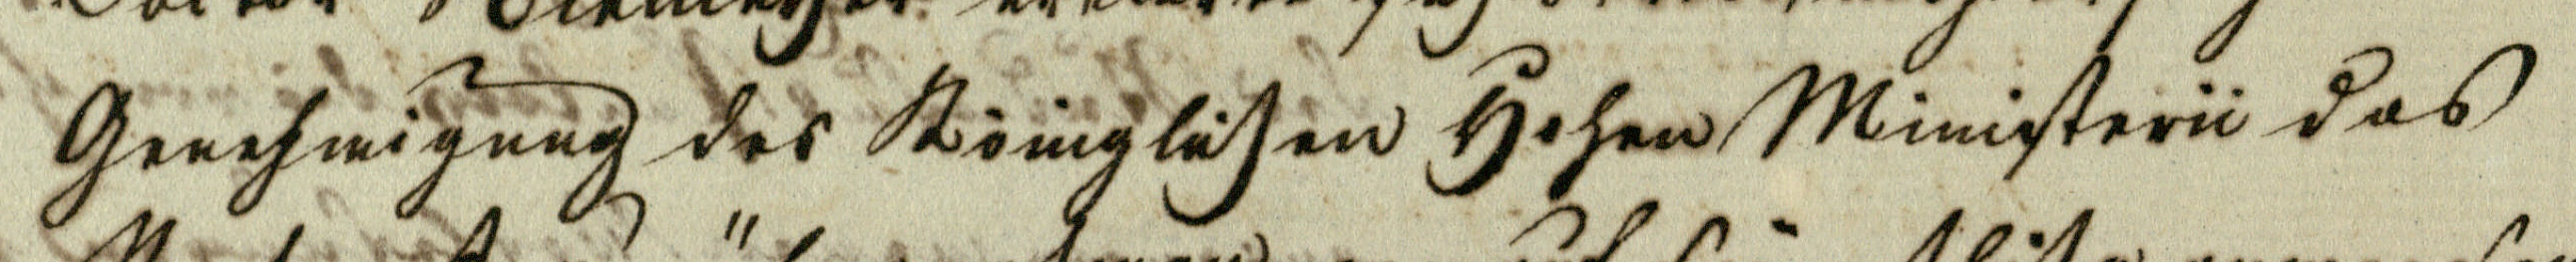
Genehmigung des Königlichen Hohen Ministerii das
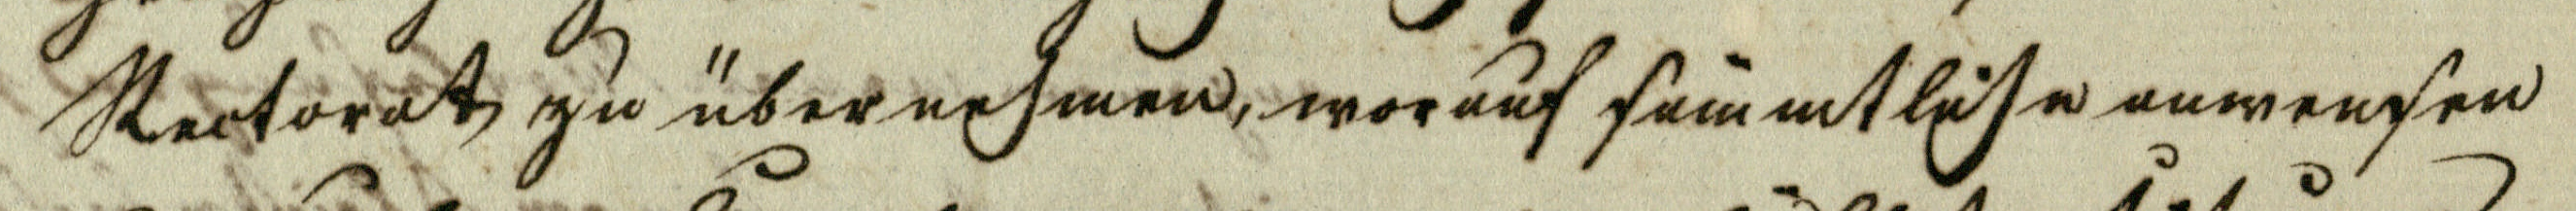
Rectorat zu übernehmen, worauf sämmtliche anwensen¬
